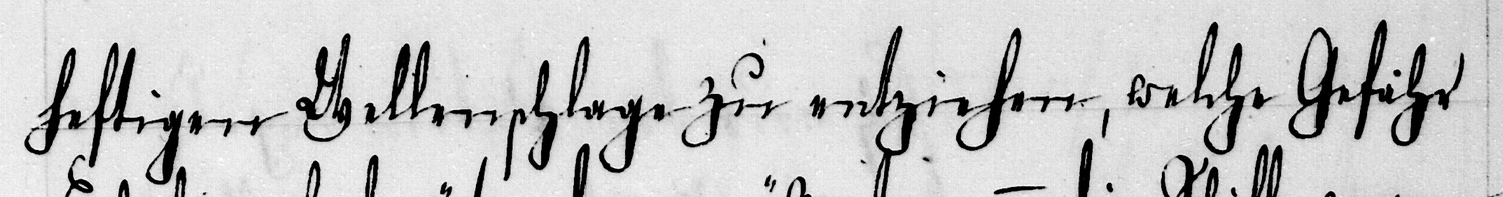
heftigen Wellenschlage zu entziehen, welche Gefahr
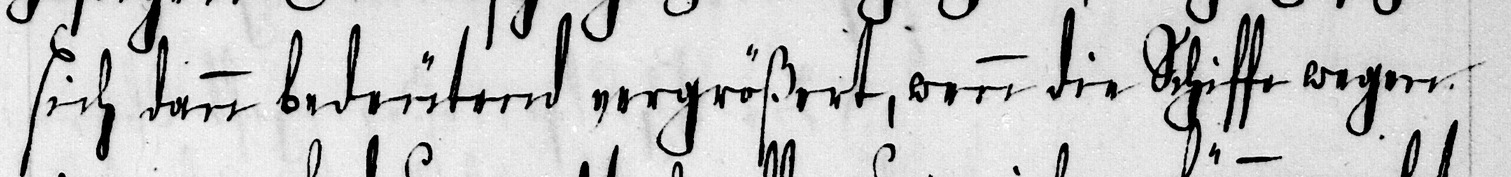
sich dann bedeutend vergrößert, wenn die Schiffe wegen
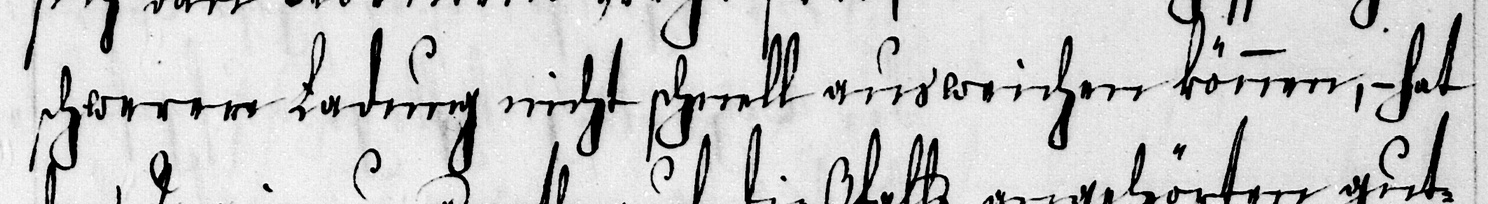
schwerer Ladung nicht schnell ausweichen können, – hat
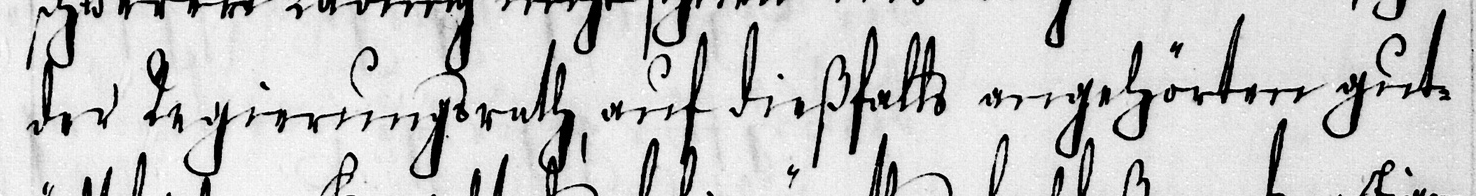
der Regierungsrath, auf dießfalls angehörten gut¬
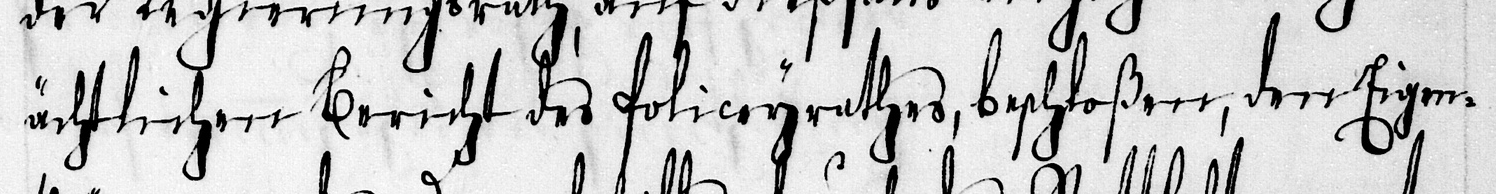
ächtlichen Bericht des Policeyrathes, beschloßen, den Eigen¬
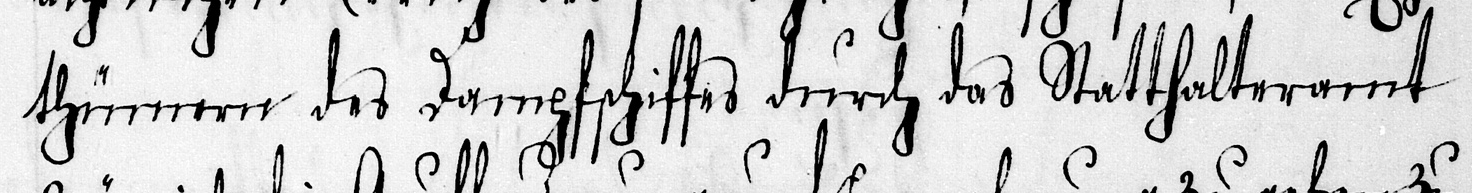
thümern des Dampfschiffes durch das Statthalteramt
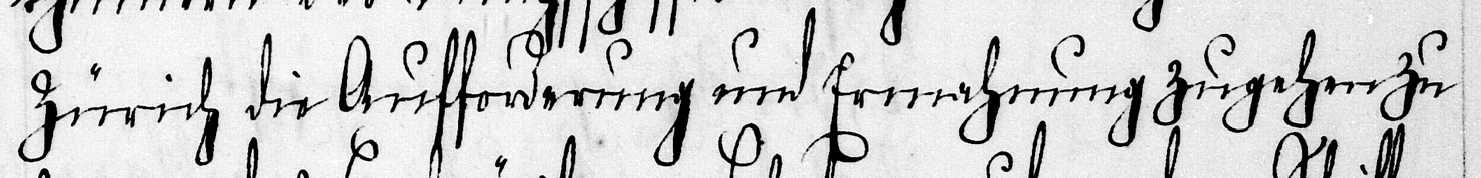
Zürich die Aufforderung und Ermahnung zugehen zu
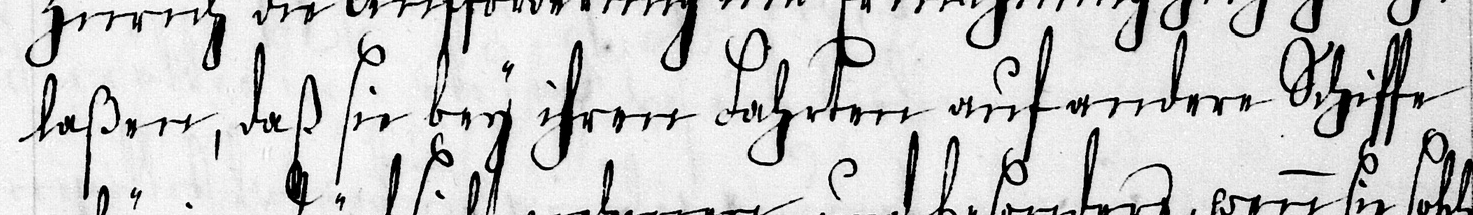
laßen, daß sie bey ihren Fahrten auf andere Schiffe
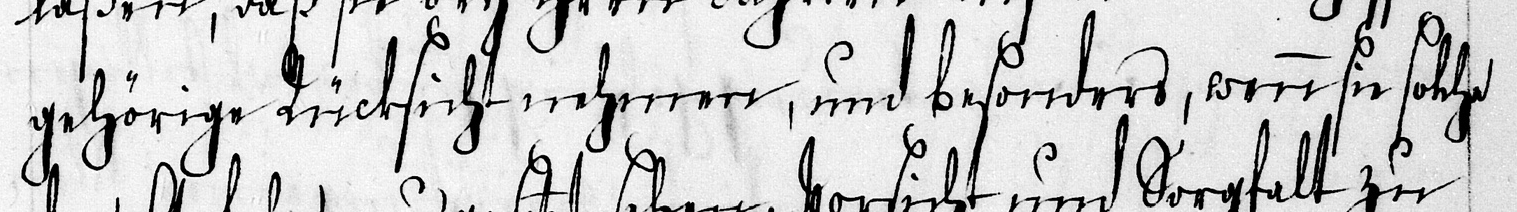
gehörige Rücksicht nehmen, und besonders, wenn sie solche
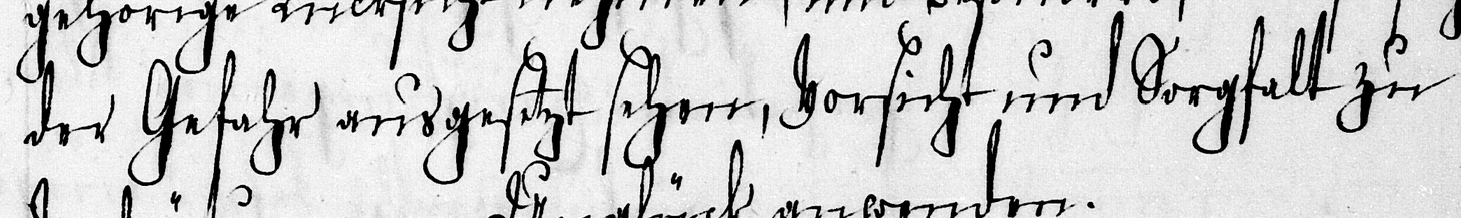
der Gefahr ausgesetzt sehen, Vorsicht und Sorgfalt zu
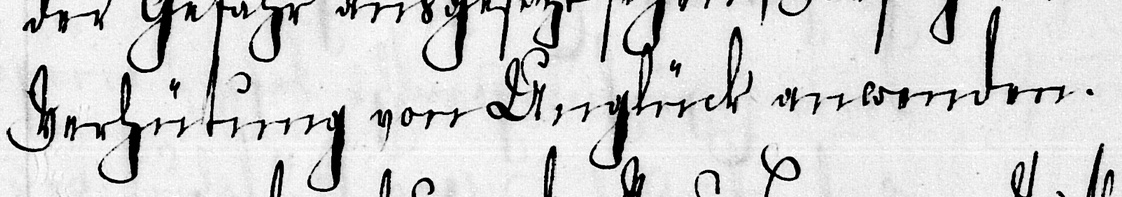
Verhütung von Unglück anwenden.
